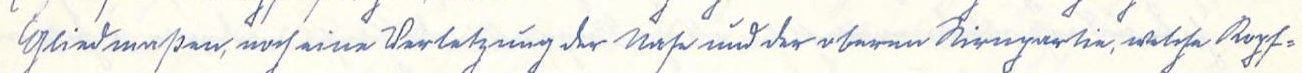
Gliedmaßen, noch eine Verletzung der Nase und der oberen Stirnpartie, welche Kopf-
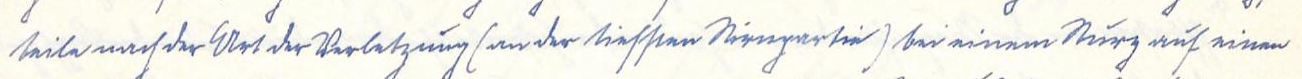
teile nach der Art der Verletzung (an der tiefsten Stirnpartie) bei einem Sturz auf einen
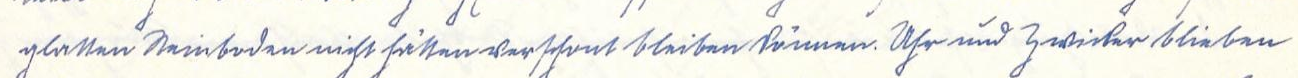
glatten Steinboden nicht hätten verschont bleiben können. Uhr und Zwicker blieben
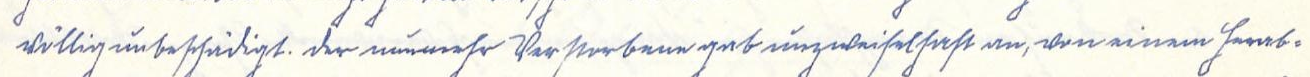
völlig unbeschädigt. Der nunmehr Verstorbene gab unzweifelhaft an, von einem Herab-
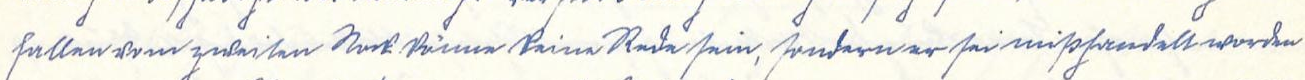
fallen vom zweiten Stock könne keine Rede sein, sondern er sei mißhandelt worden.
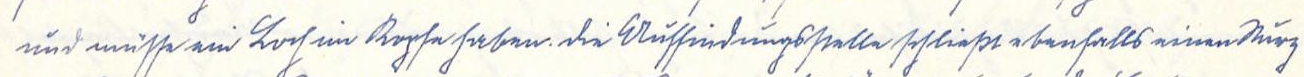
und müsse ein Loch im Kopfe haben. Die Auffindungsstelle schließt jedenfalls einen Sturz
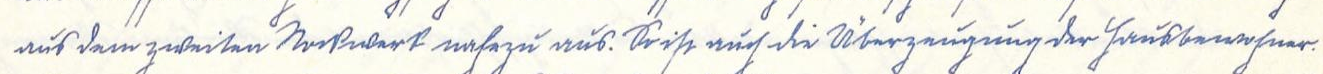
aus dem zweiten Stockwerk nahezu aus. So ist auf die Überzeugung der Hausbewohner.
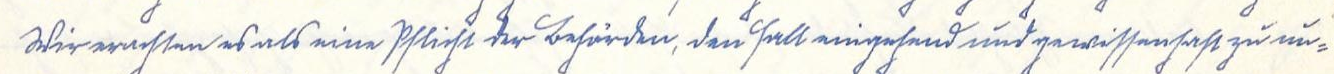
Wir erachten es als eine Pflicht der Behörden, den Fall eingehend und gewissenhaft zu un-
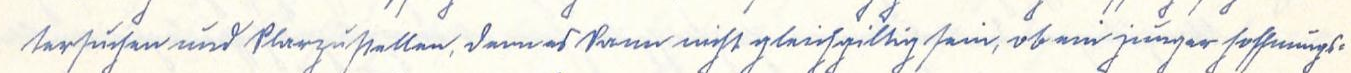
tersuchen und klarzustellen, denn es kann nicht gleichgültig sein kann, ob ein junger hoffnungs-
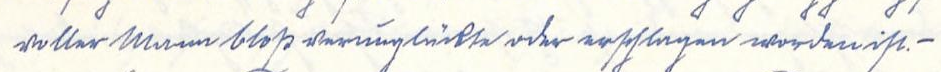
voller Mann bloß verunglückte oder erschlagen worden ist.
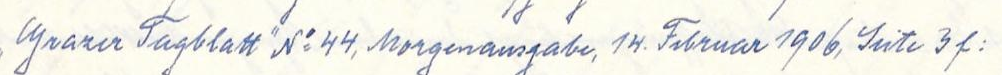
„Grazer Tagblatt" Nr 44, Morgenausgabe, 14. Februar 1906, Seite 3f:
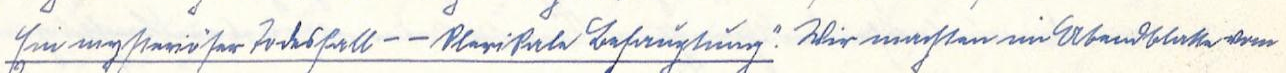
Ein mysteriöser Todesfall - klerikale Behauptung.“ Wir machten im Abendblatte vom
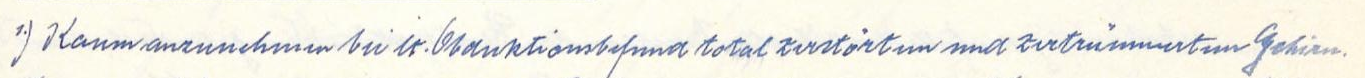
1) Kaum anzunehmen bei lt. Obduktionsbefund total zerstörtem und zertrümmertem Gehirn.
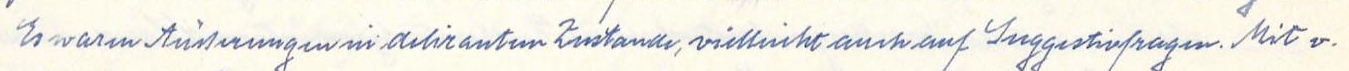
Es waren Äußerungen in delirantem Zustande, vielleicht auch auf Suggestivfragen. Mit v.
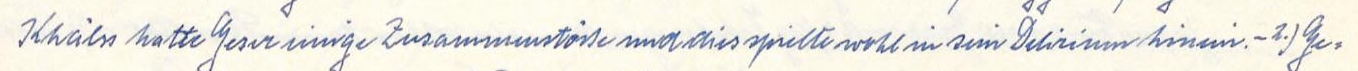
Khäls hatte Geser einige Zusammenstöße und dies spielte wohl in sein Delirium hinein. 2) Ge-
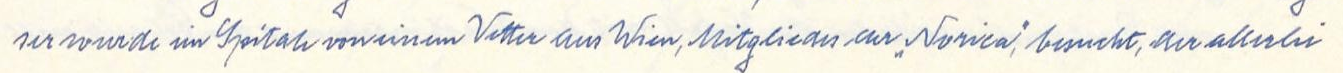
ser wurde im Spital von einem Vetter aus Wien, Mitglied der Norica“, besucht, der allerlei
